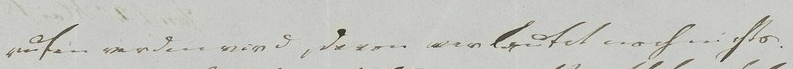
rufen werden wird, davon verlautet noch nichts.
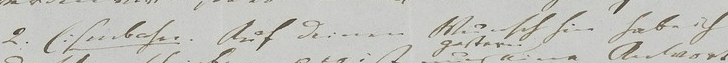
2. Eisenbahn. Auf deinen Wunsch hin habe ich
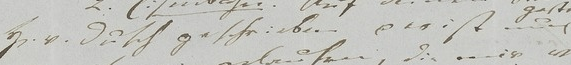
H. v. Dusch geschrieben & es ist nun gestern eine
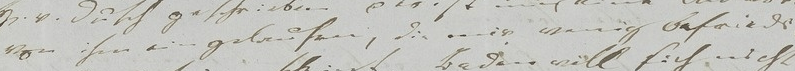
von ihm eingelaufen, die mir wenig befriedi-
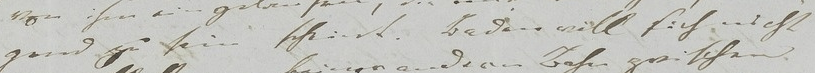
gend zu sein scheint. Baden will sich nicht
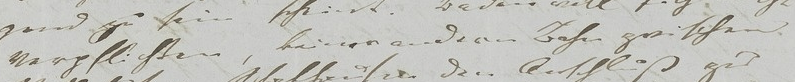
verpflichten, keiner andern Bahn zwischen
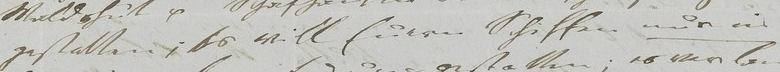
gestatten; es will Euern Schiffen nur in
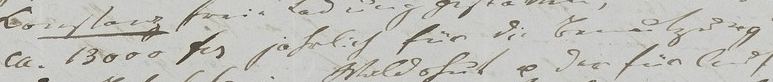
ca. 13 000 fcs jährlich für die Benutzung
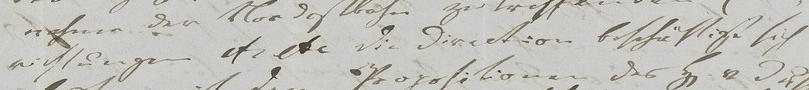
richtungen etc etc Die Direction beschäftigt sich
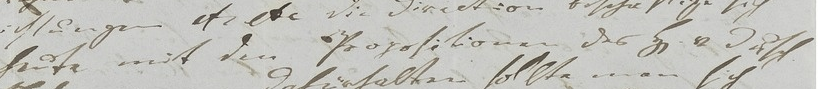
heute mit den Propositionen des H. v. Dusch.
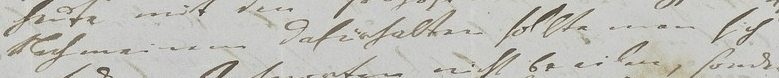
Nach meinem Dafürhalten sollte man sich
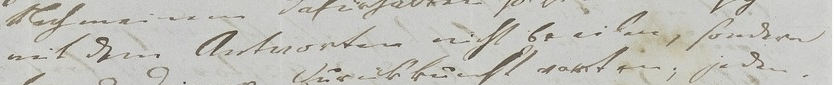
mit dem Antworten nicht beeilen, sondern
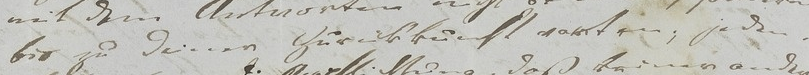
bis zu deiner Zurückkunft warten; jeden-
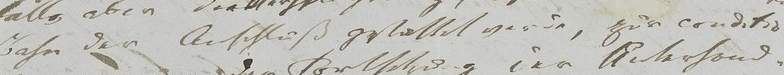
Bahn der Anschluß gestattet werde, zur conditio
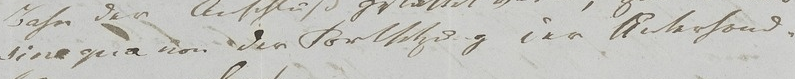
sine qua non der Fortsetzung der Unterhand-
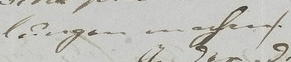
lungen machen.
